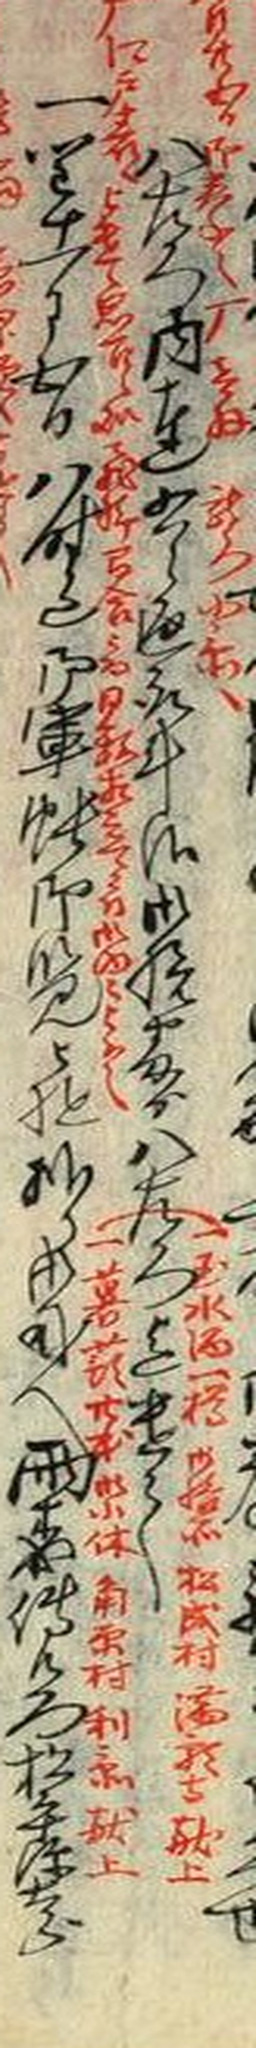一閏十一月五日八時過御軍帳御覧被遊掛り御用人雨森伝左衛門松平源太郎
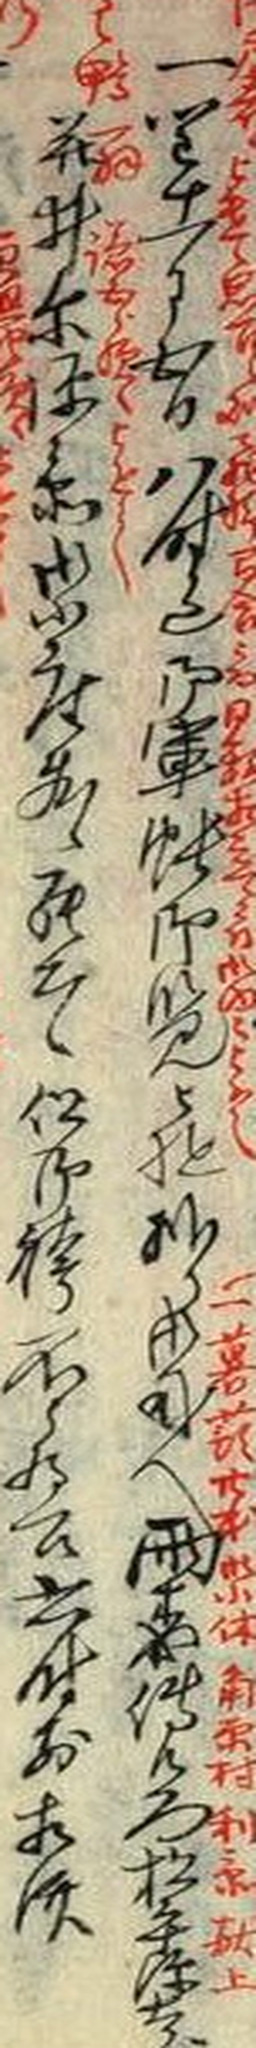幷井原源兵衛御小座敷へ罷出候但御袴不被為召六時前相済
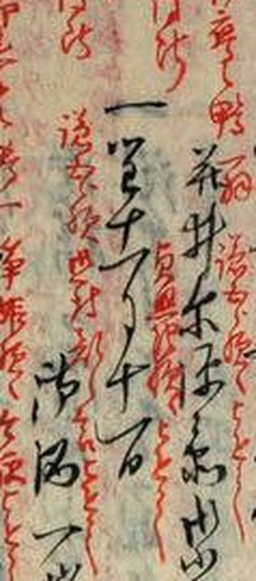一閏十一月十一日
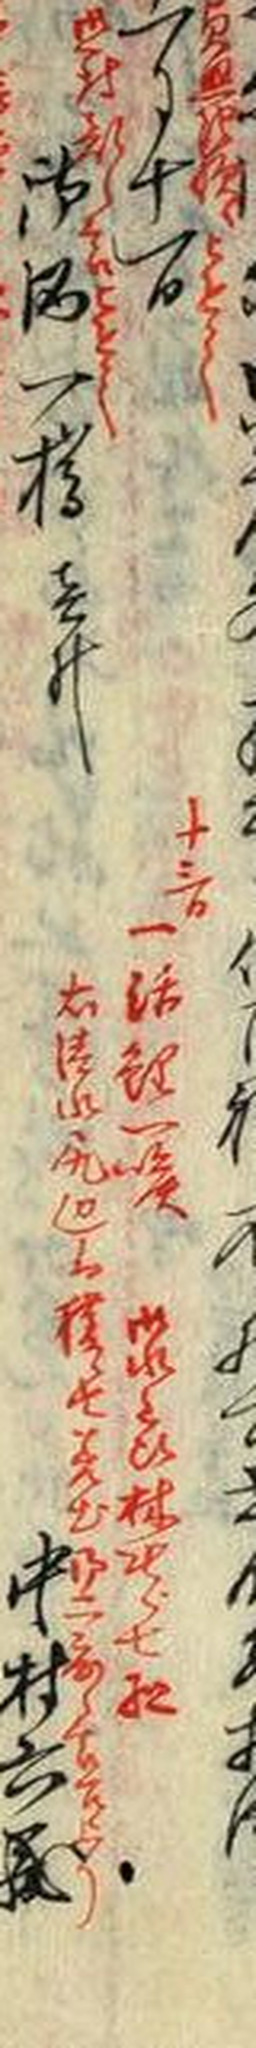御酒一樽壱升中村六蔵
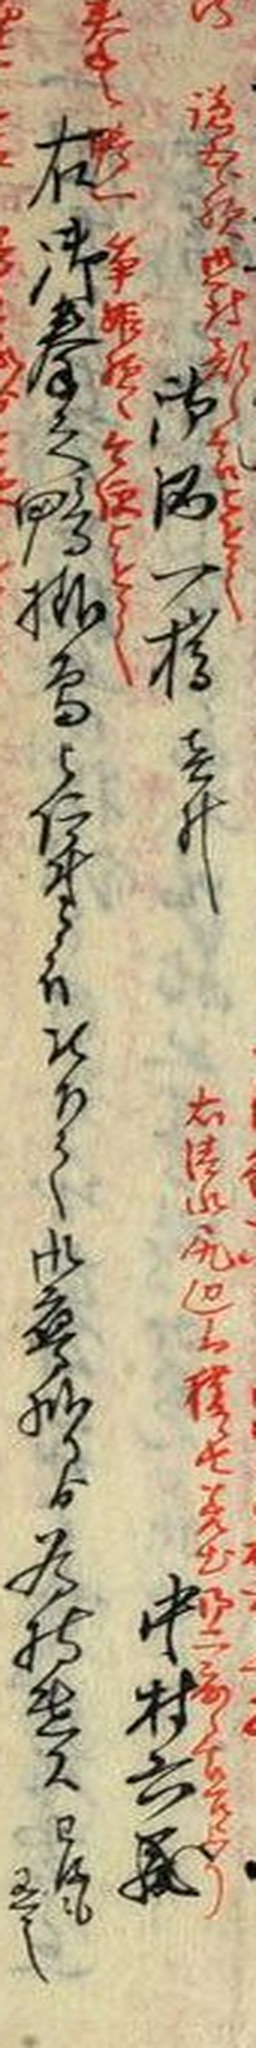右御拳之鴨掛鳥被仰付候ニ付被下之御鷹掛りゟ為持遣ス已後も有之

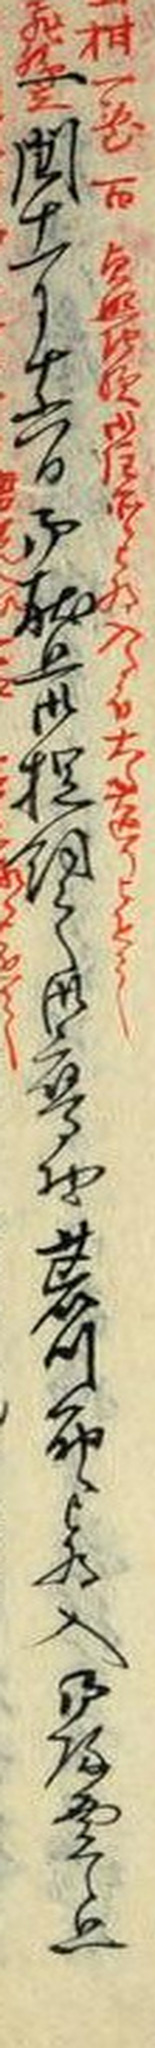一閏十一月十六日御献上御捉飼之御鷹野荒川筋へ被為入御帰殿之上
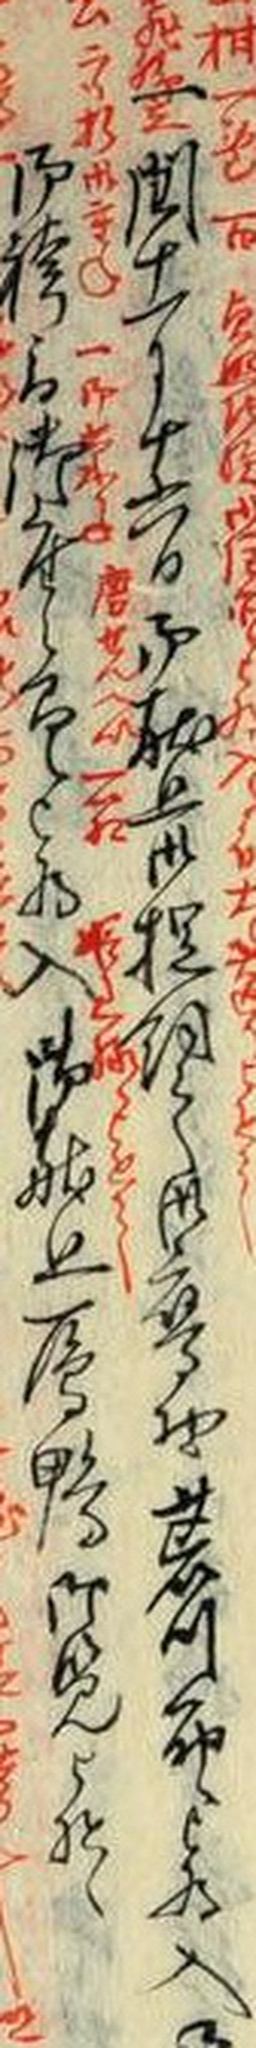御袴ニ而御座之間へ被為入御献上鳫鴨御覧被遊候
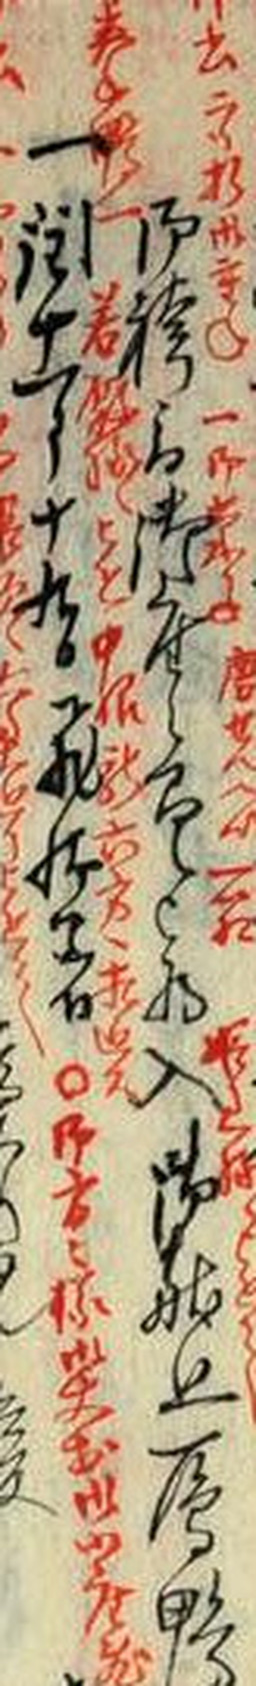一閏十一月十九日飛脚着
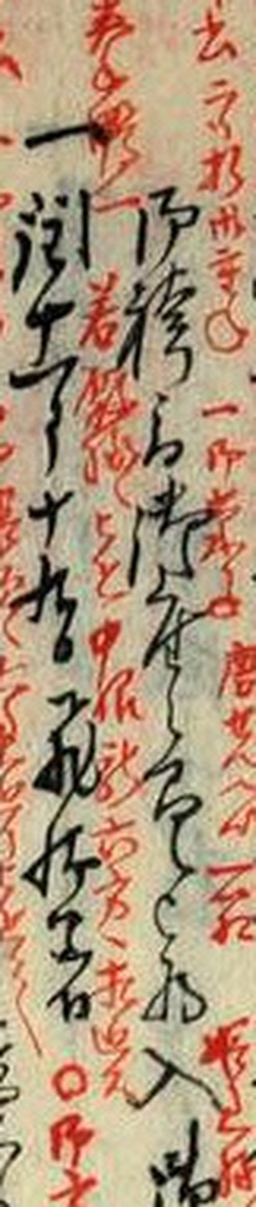一閏十一月十九日飛脚着
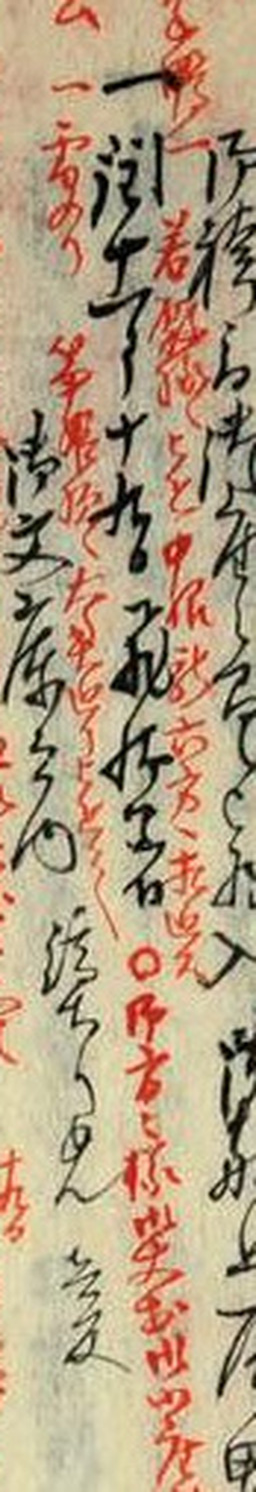御文庫之内縞ちりめん壱反
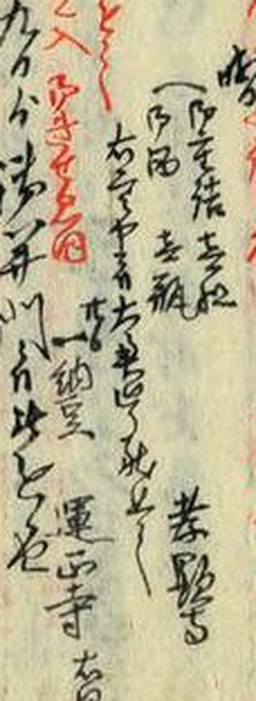右寒中ニ付大奥廻り献上之
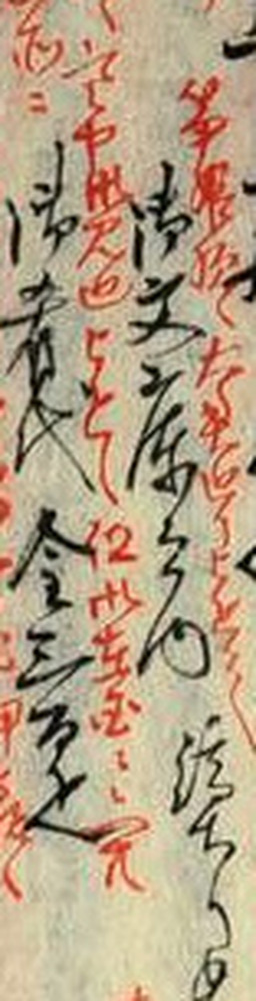御肴代金三百疋
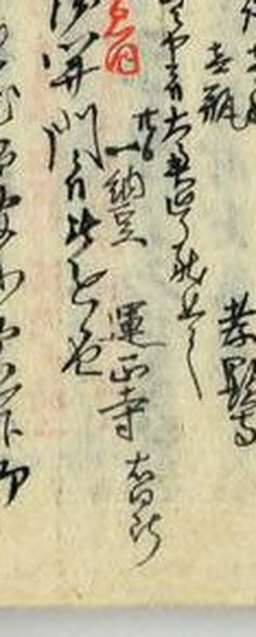一納豆運正寺右同断
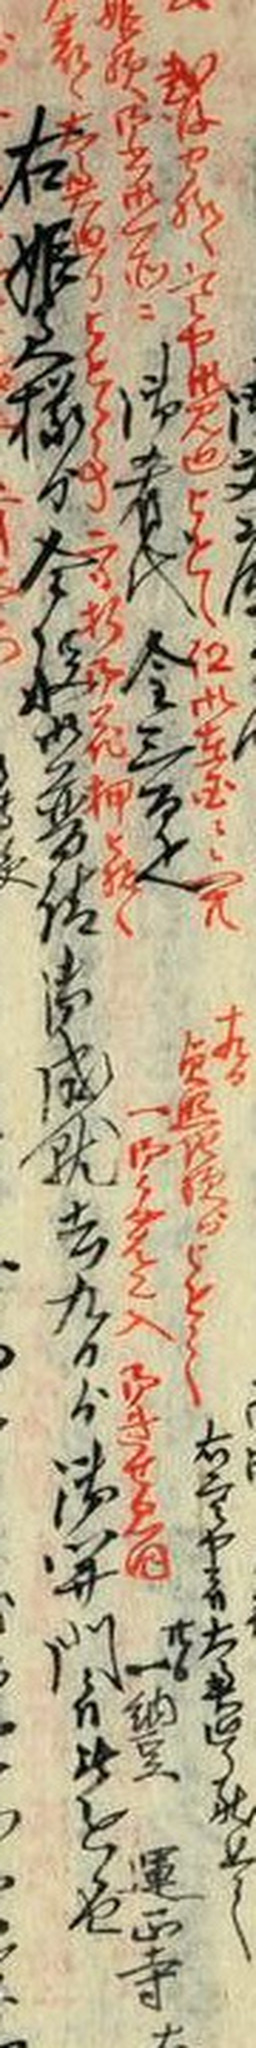右姫君様ゟ今般御普請御成就去九日ゟ御開門ニ付被進候由
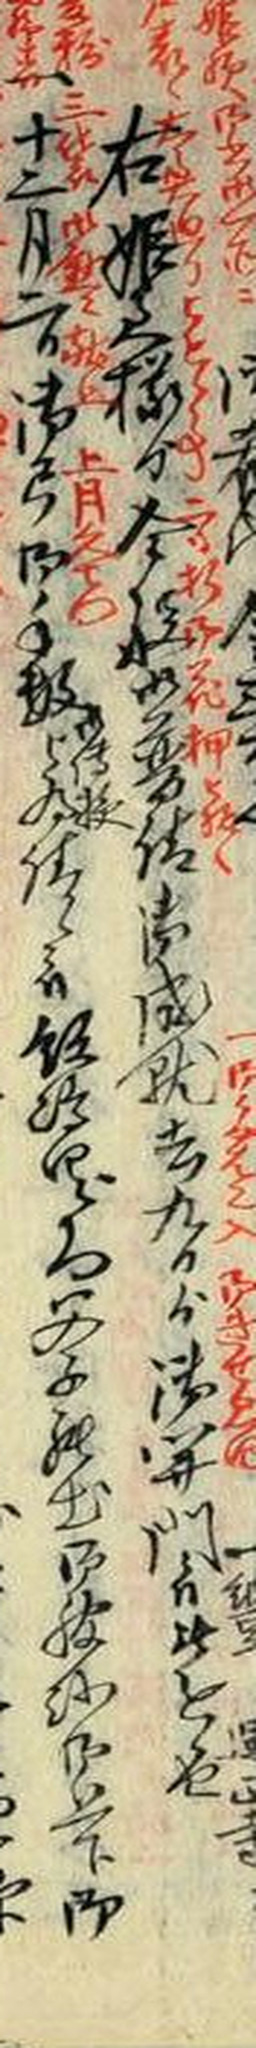一十二月二日御弓御手数御伝授被為請候ニ付飯嶋四郎右衛門父子罷出御服紗御上下御
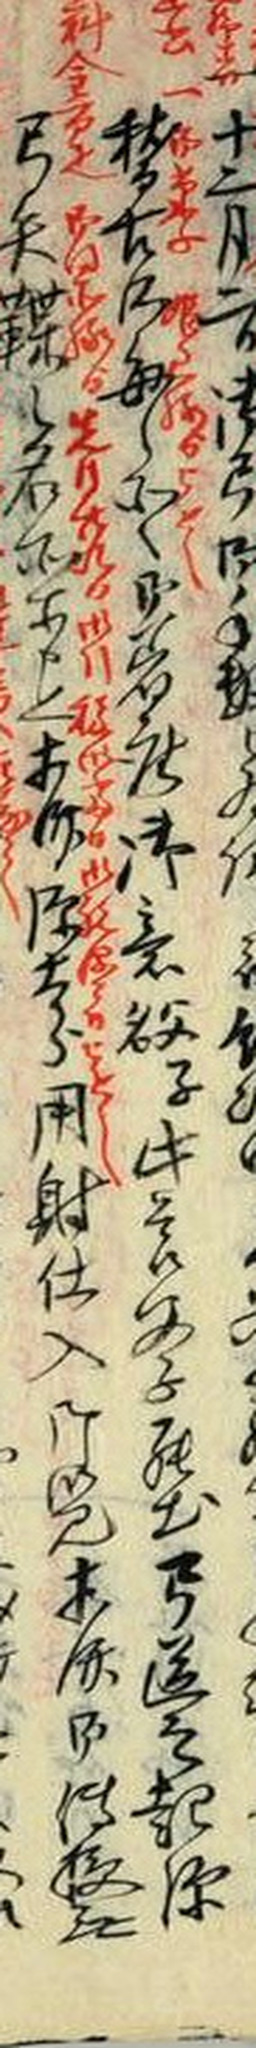弓矢鞢之名所等申上相済源太郎用射仕入御覧相済御伝授無
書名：少傅日録抄（斉承付側向頭取日記、在国）
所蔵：福井県文書館 Fukui Prefectural Archives
